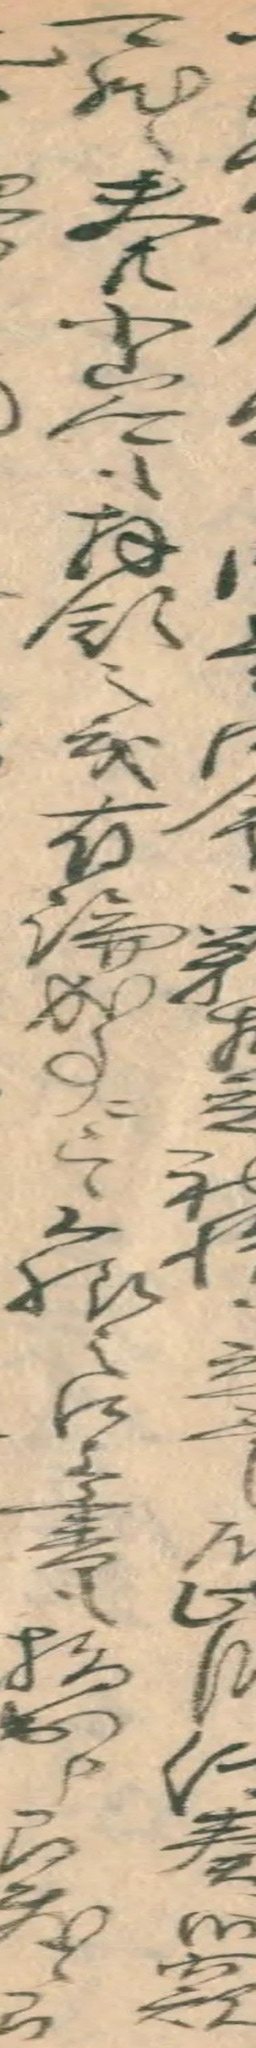可然候夫共小山郷も拝領之義有論成事ニ候ハヽケ様之口上書も指出申間敷候間
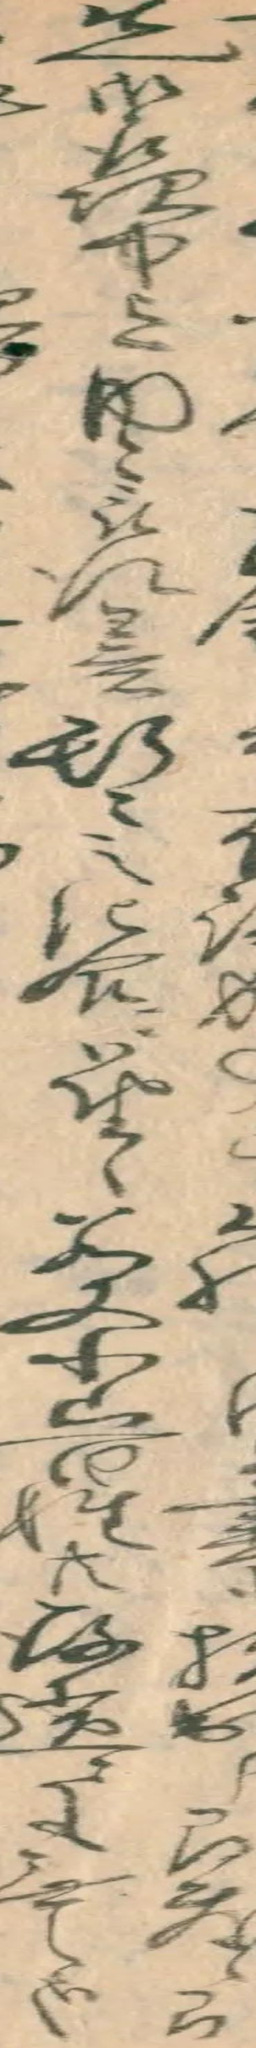先御取次中迄内々被得御意斯々之仕合ニ御座候若又小山百姓共存違ニも無之哉
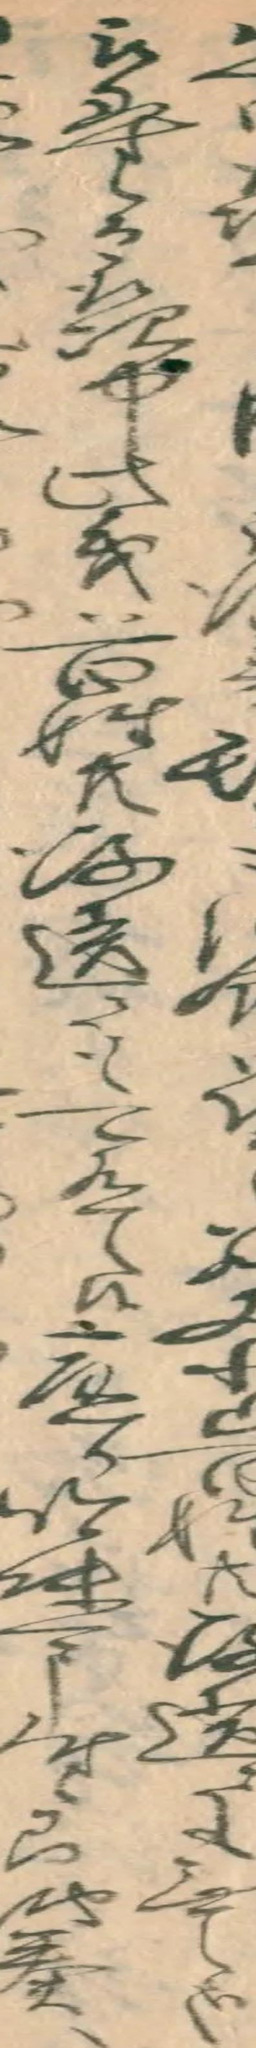被尋候而取次中此義ハ百姓共存違ニても可有之候一通り吟味可申付候間伝奏へ
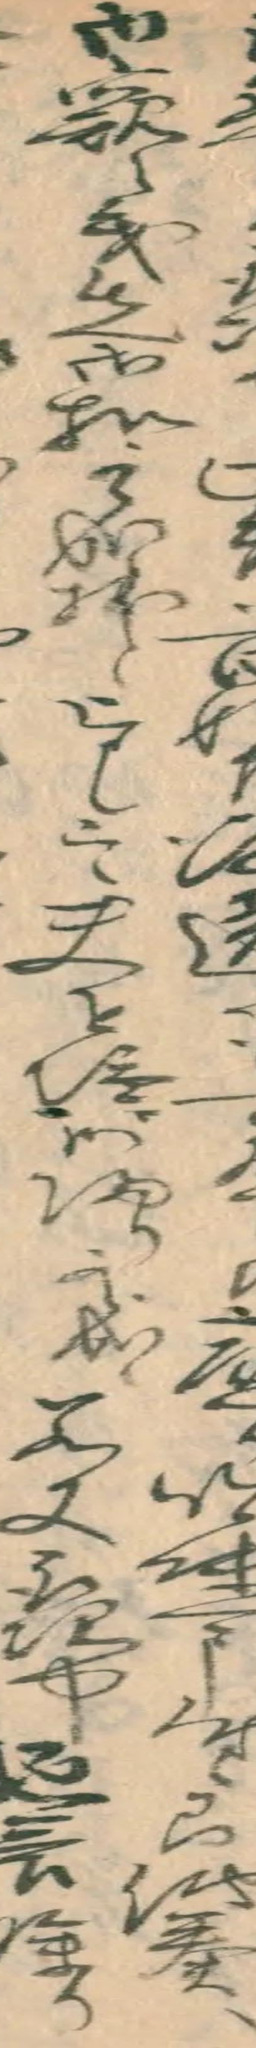御窺之義先御扣可成抔と被申候ハヽ夫を塩ニ御帰り可被成候若又取次中返答余り
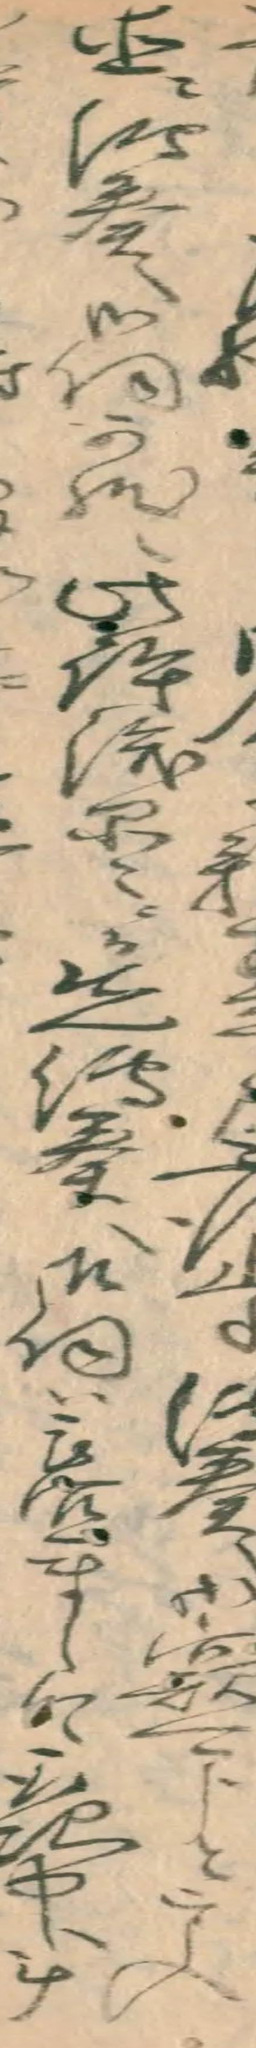直ニ伝奏へ御伺可然候此評議品々ニ而先伝奏へ御伺ハ被宜ましく候取次中へ計
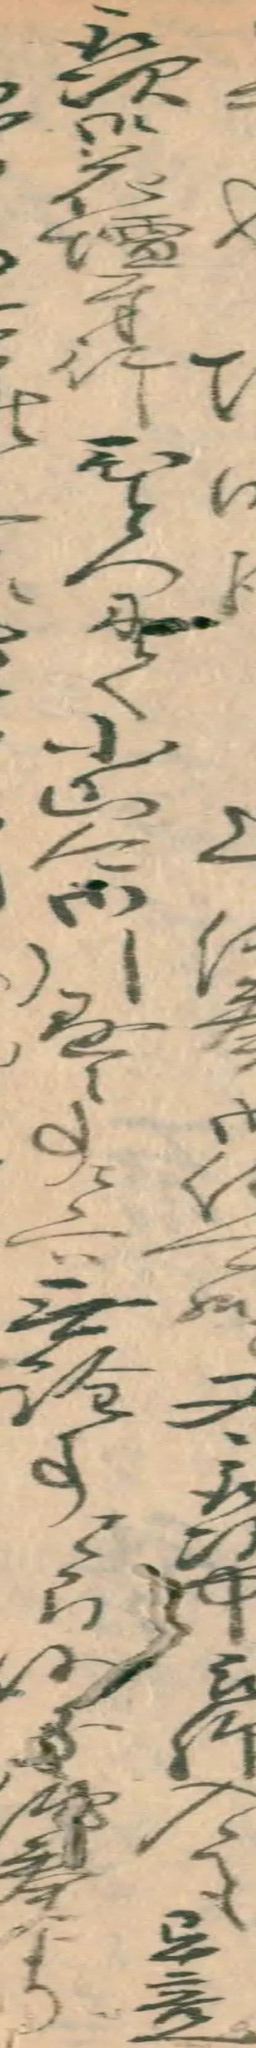取次御花壇奉行ひとつにて小山郷御引懸之事ニ候へハ無詮事ニ候間何伝奏より
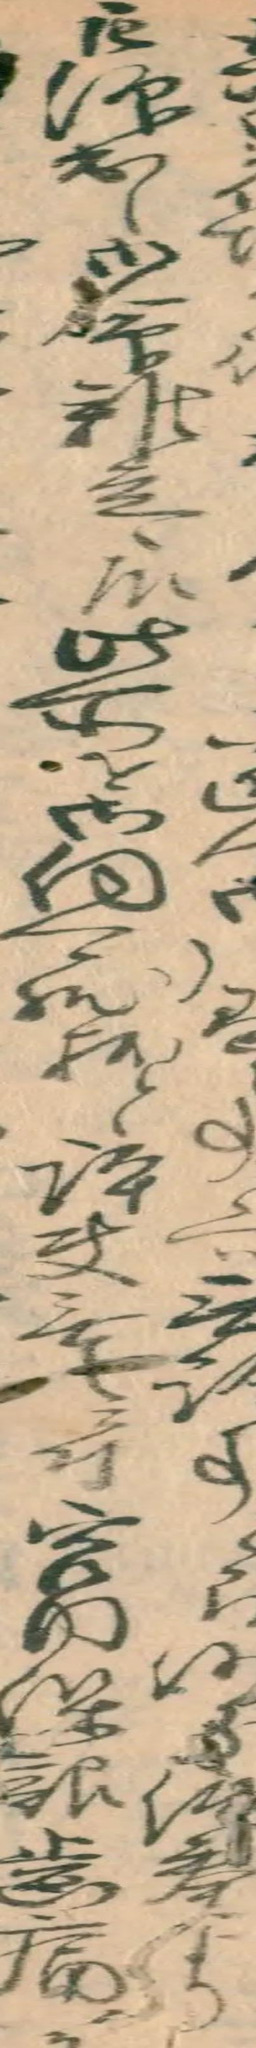被仰出候御命難立候故此所を御伺可然抔と評決無之ニ付宮内保韶歯痛ニ而
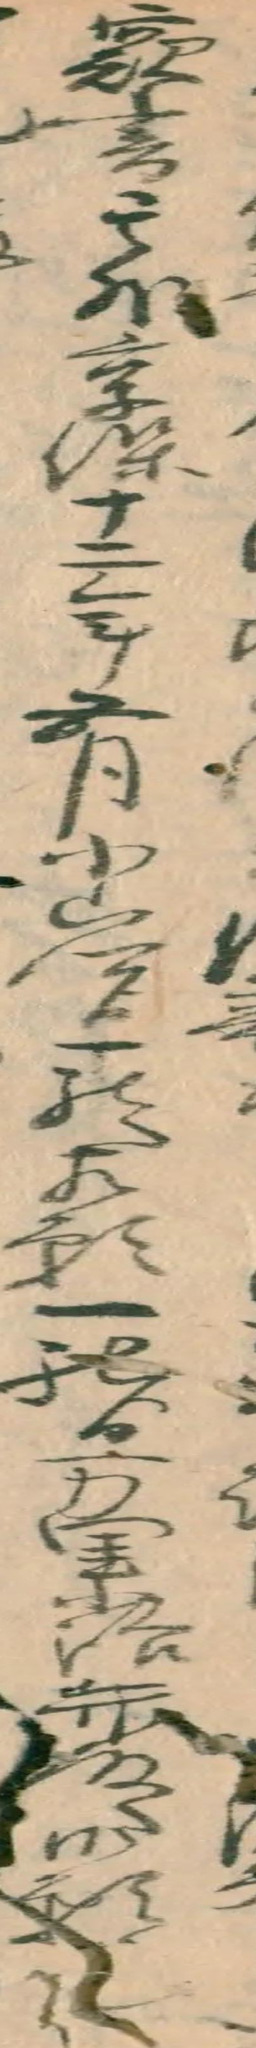窺書其外享保十二年五月小山郷ゟ一社へ相願一社ゟ万里小路弁殿へ御願
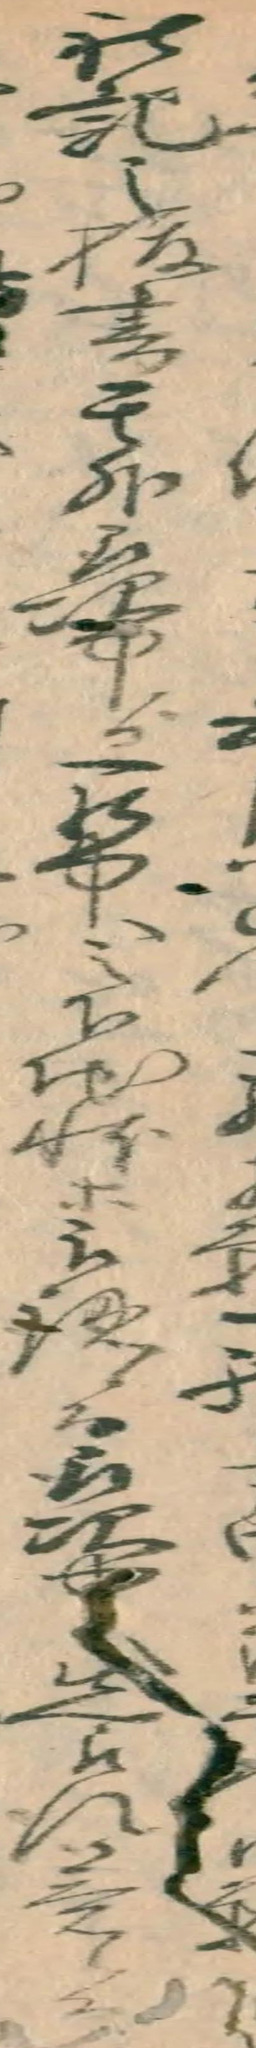社記之抜書其外取次中ゟ一社中へ之下地状等被認候而取次中へ先被得御意候而
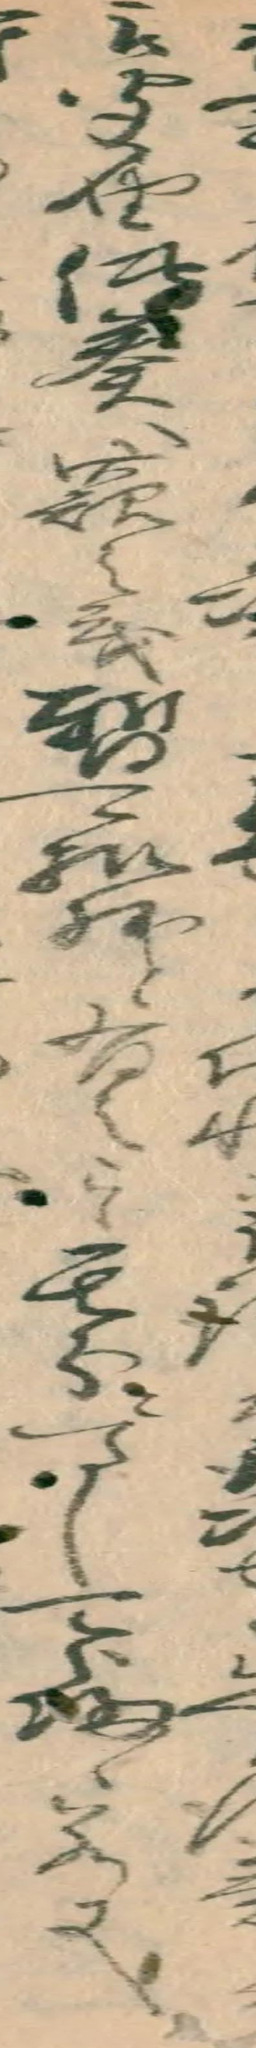被聞届伝奏へ窺之義暫可扣抔と有之候ハヽ其分ニいたし可被帰候若又
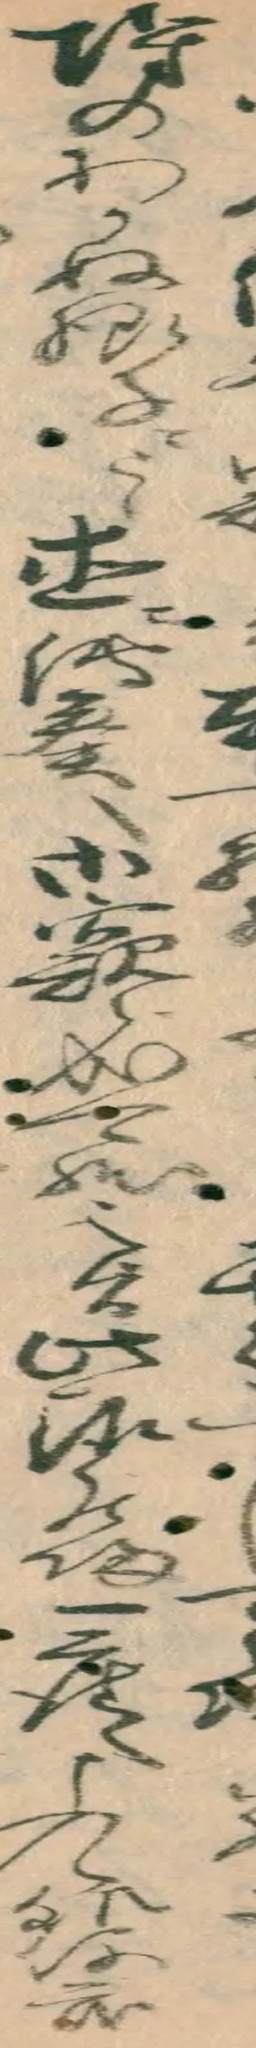埒のあかぬ様子ニ候ハヽ直ニ伝奏へ御窺被成可然之旨此趣罷帰一座へ申入候処何も
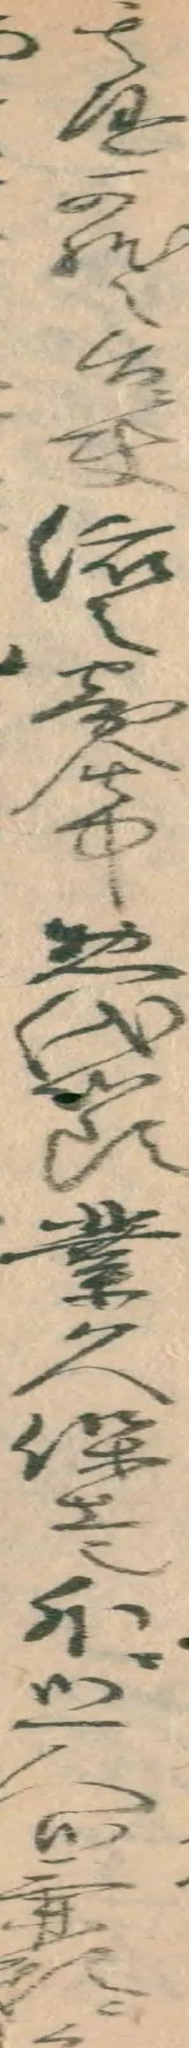其通可然之旨ニ決依之寄会中惣代出頭業久保土也外ニ御一人御兼頼ニ而
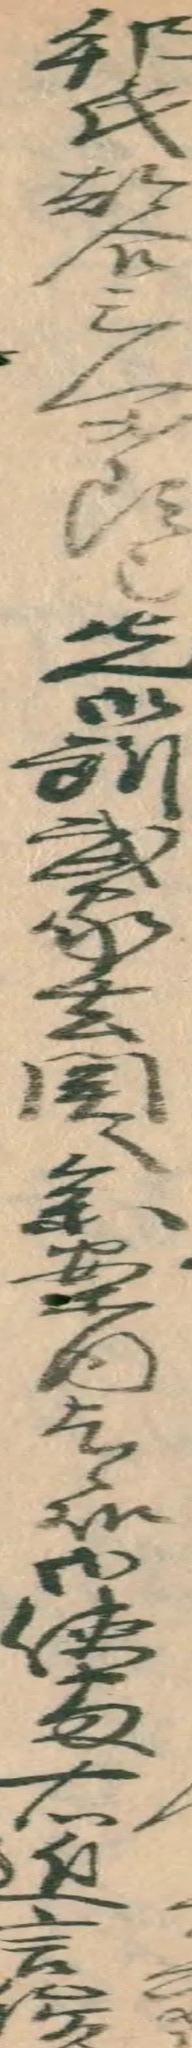邦氏都合三人出頭也先御所武家玄関へ参案内乞候処御使番右近言俊
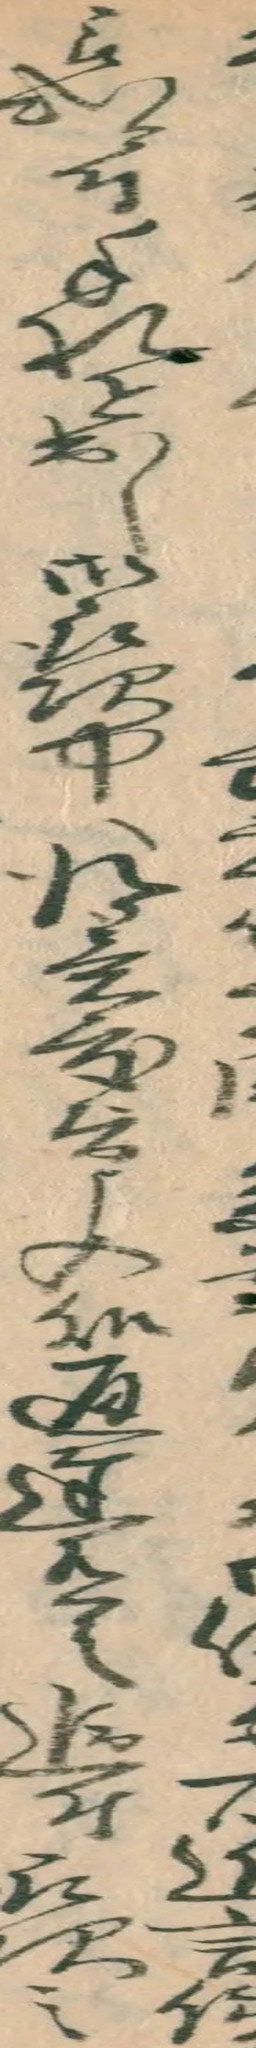被出候付手札を出し御取次中へ得御意度旨申入処通達有之追付取次之
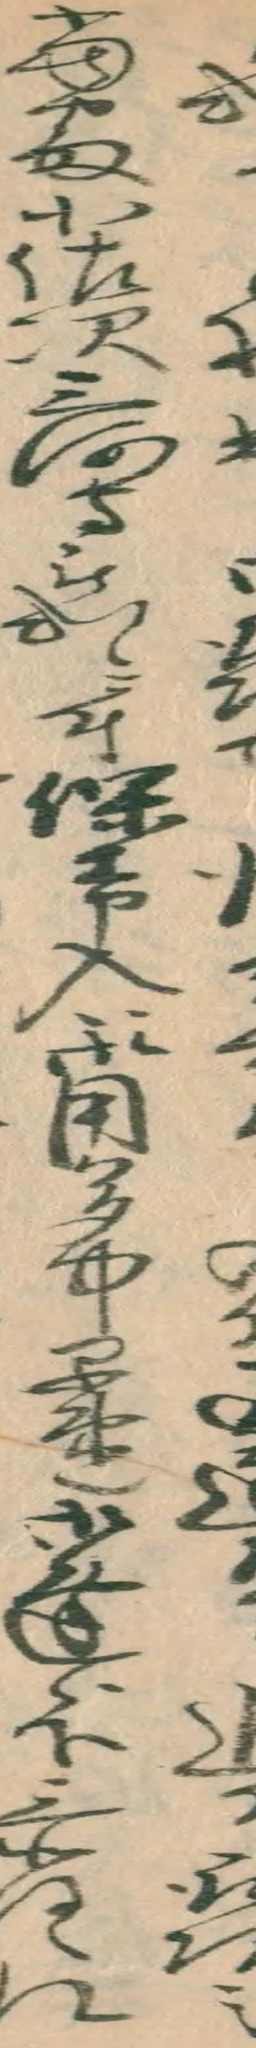当番小佐次三河守被出候ニ付保土申入ハ御用多中早速御逢被下忝存候得
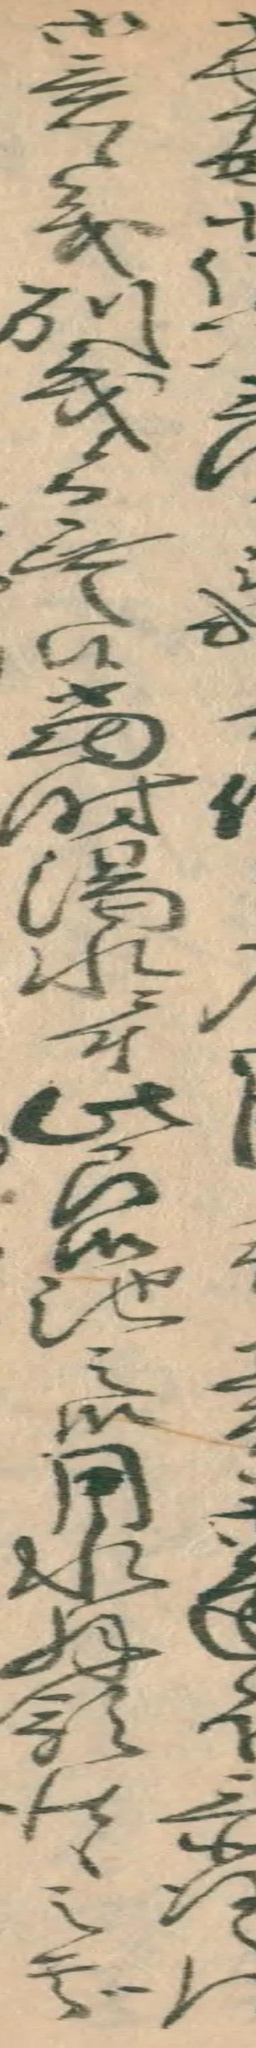御意候義別義ニ而無之候当時渇水ニ付此間御池之御用水拝領仕候之処
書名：賀茂社記録. 第58冊
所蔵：国立国会図書館 National Diet Library, JAPAN
